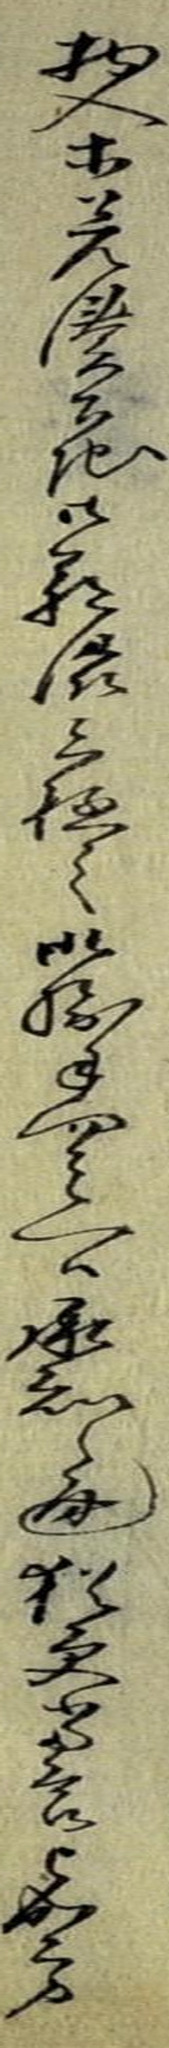物入等差湊下地御難渋至極之御勝手向に候へは承知之通猶更当節被成方
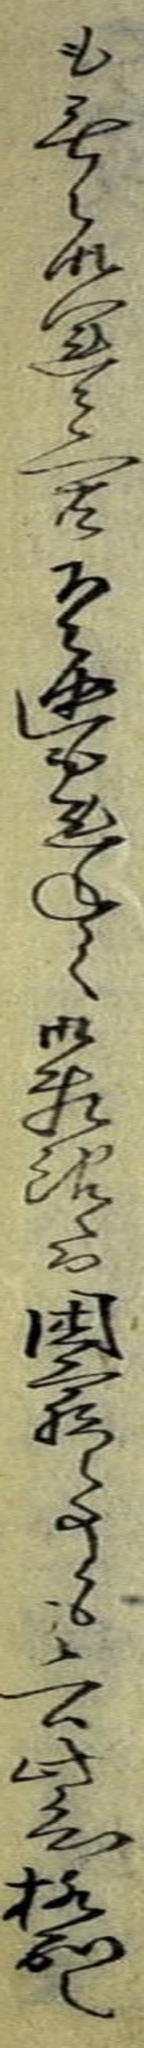も無之御運に候へ共下々迚も連年之御頼銀に而困窮之事にも候へは此度格別之
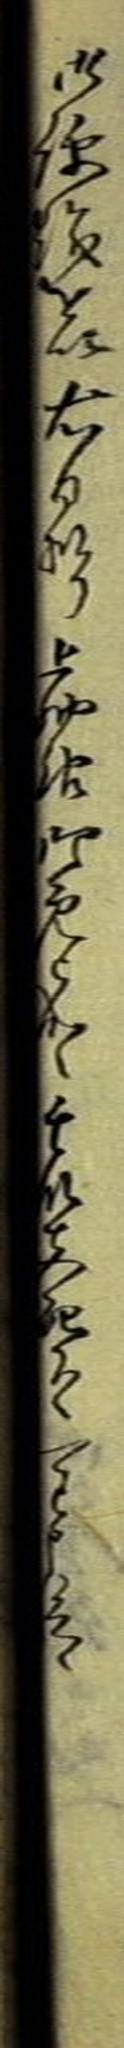御評議を以右日掛り上納銀御免被成候其段支配下へ可被申渡候
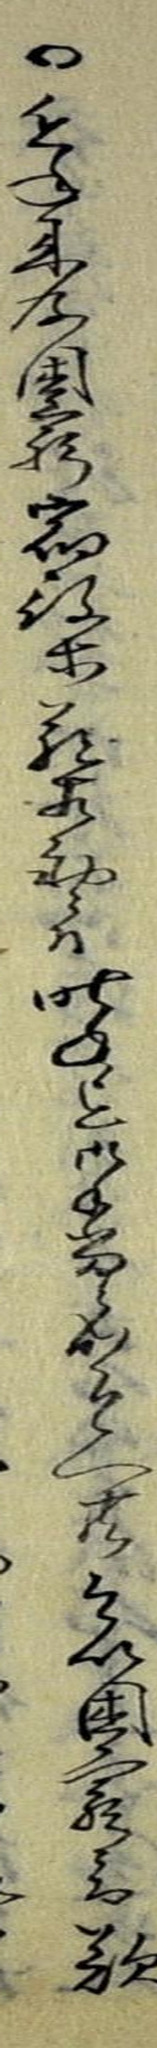○近年來及困窮宿役等難相勤に付昨年迄御手当被成下候へ共今以困窮に而歎
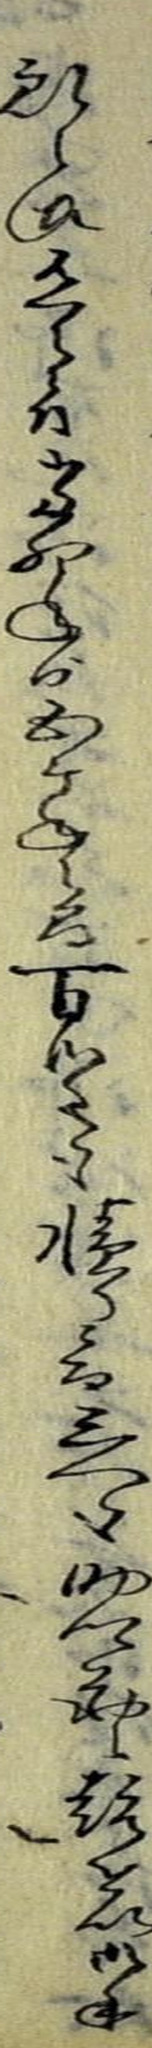願候趣有之候に付当卯年ゟ五ヶ年之間一日弐匁つヽ積りに而三人つヽ助郷勤候趣を以御手
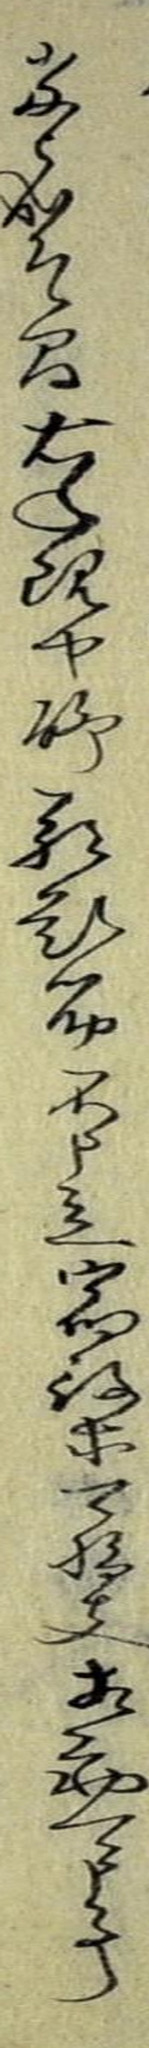当被成下候間右年限中聊難題筋不申立宿役等可指支相勤可申事
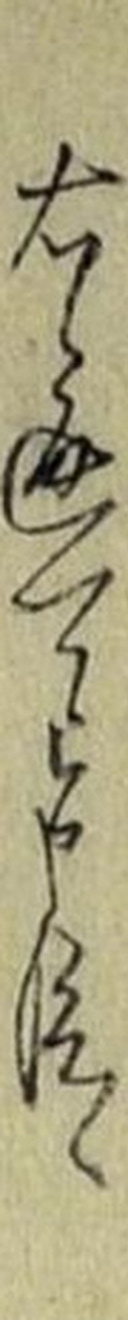右之通可被申渡候
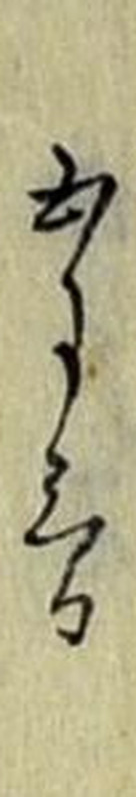五月三日
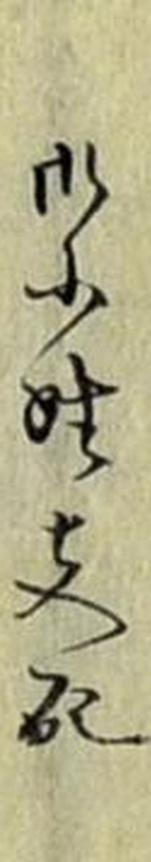御小姓支配
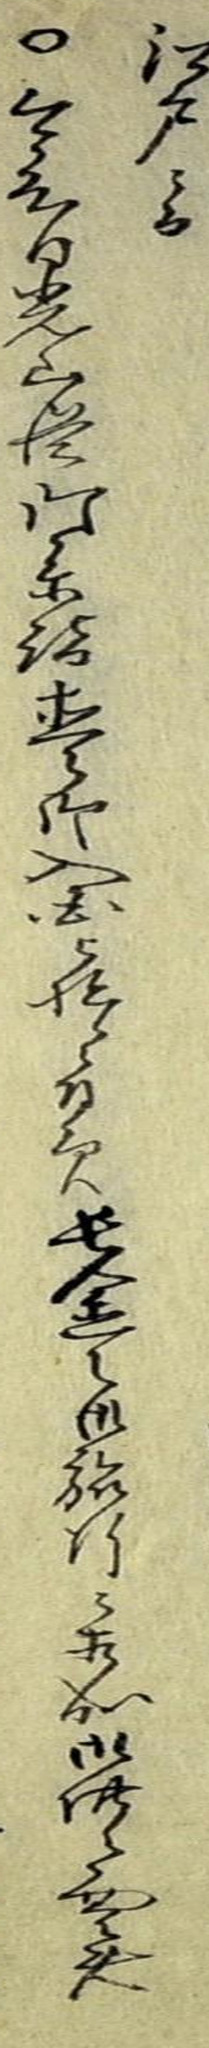○今度日光山従御参詣直々御入国被遊候に付而は長途之御旅行に相成御供之面々失
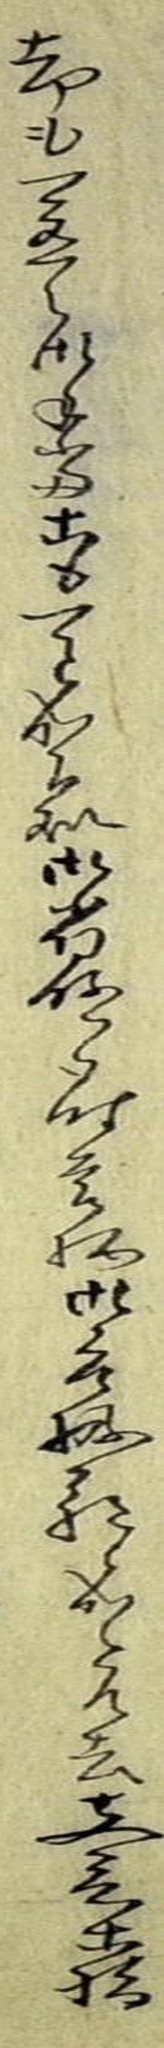却も可有之御手当等も可被成下処御省略之御時節柄御取扱難被成候乍去支度等相指
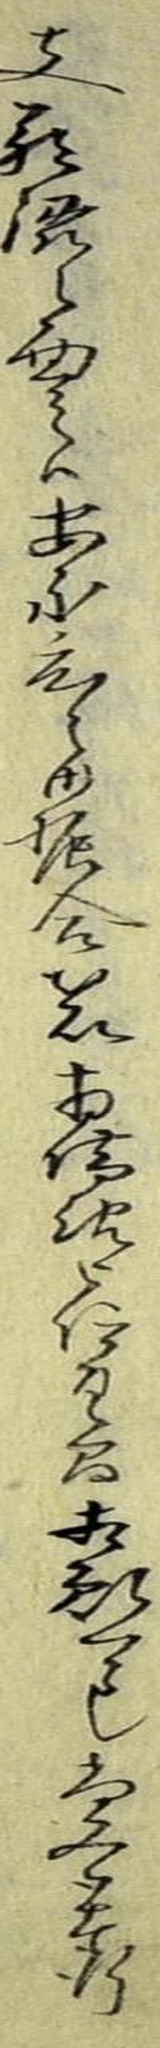支難渋之面々は安永度之御振合を以拝借銀被仰付候間相願可申候尚又御奉行
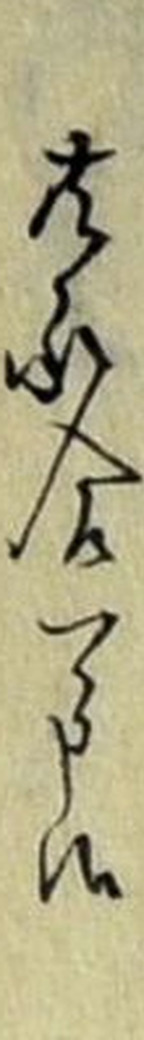共承合可申候

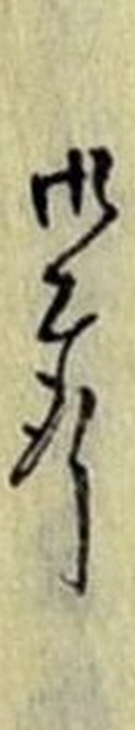御奉行
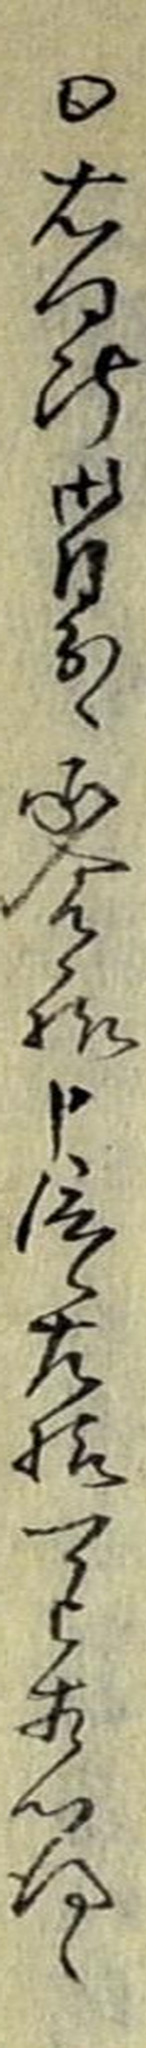○右同断御自分へ承合候様申渡候左様可被相心得候
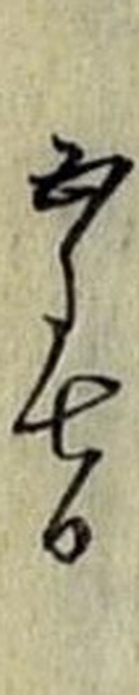五月七日
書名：命令之部 六
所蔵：福井県文書館 Fukui Prefectural Archives
